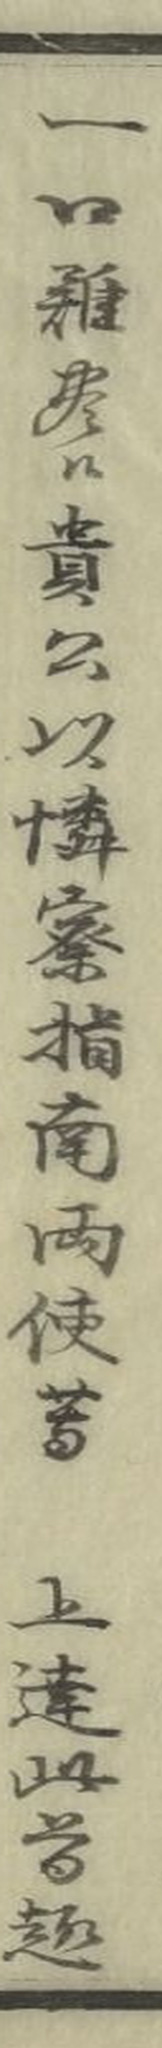一口難尽候貴公以憐察指南両使者上達此旨趣
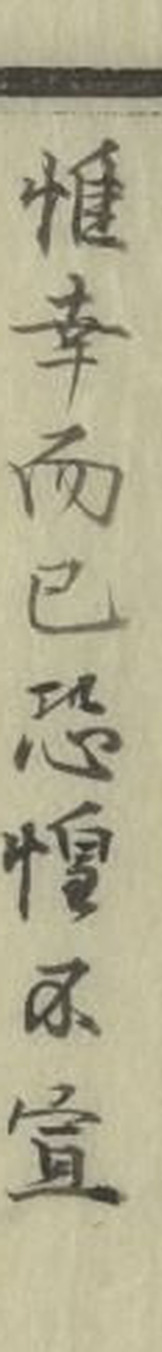惟幸而已恐惶不宣
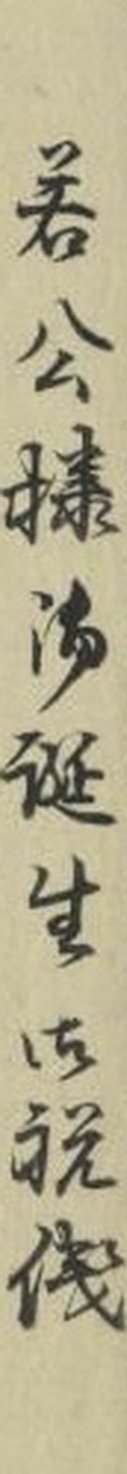若君様御誕生御祝儀
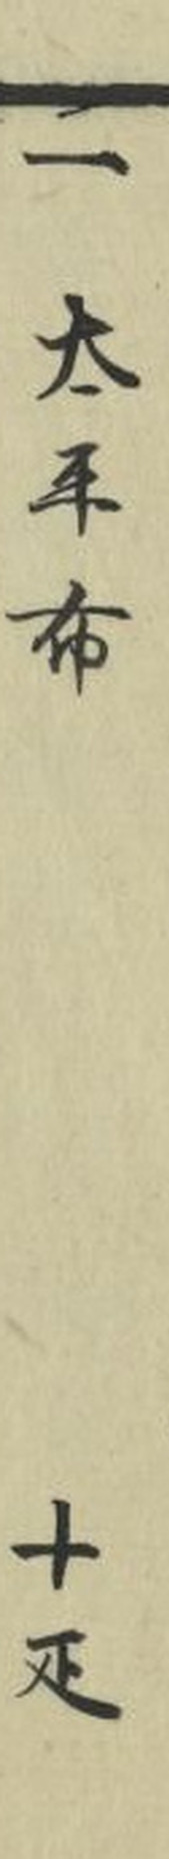一太平布十疋
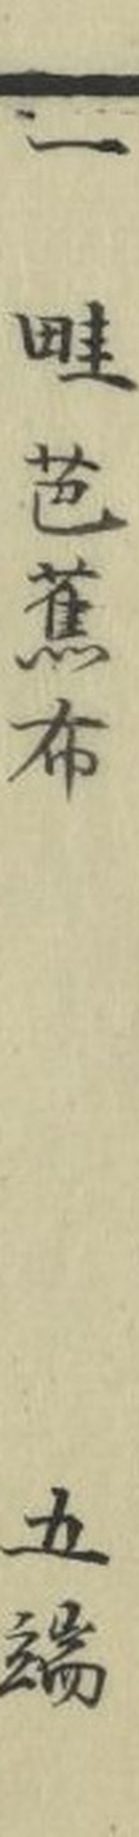一畔芭蕉布五端
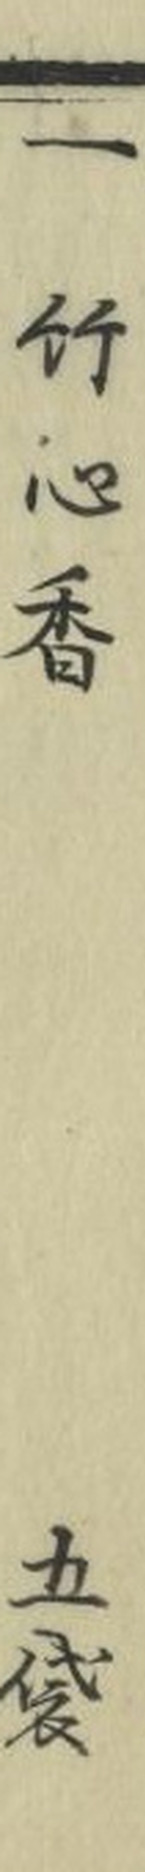一竹心香五袋
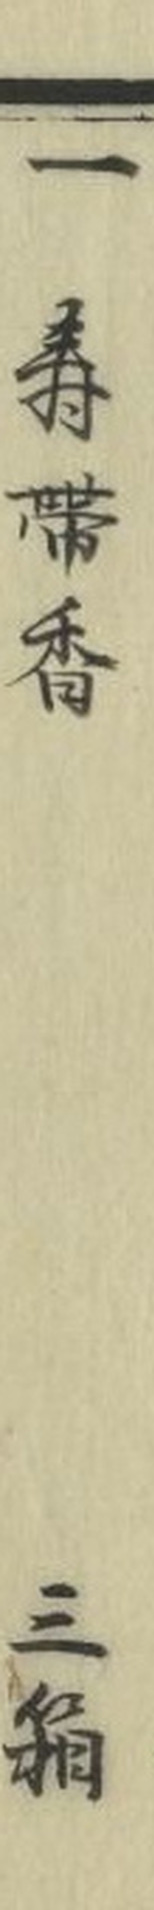一寿帯香三箱
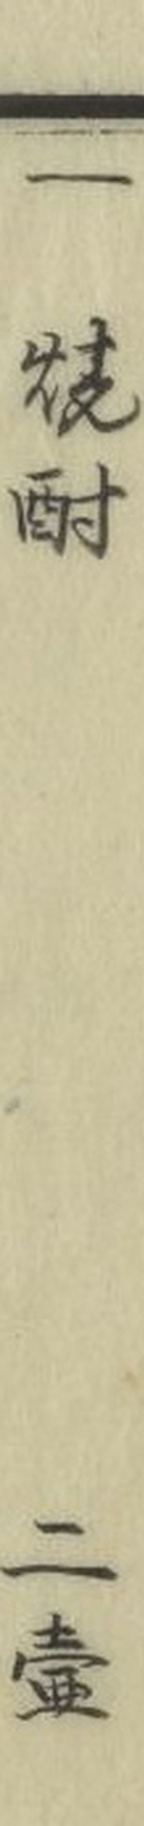一焼酎二壺
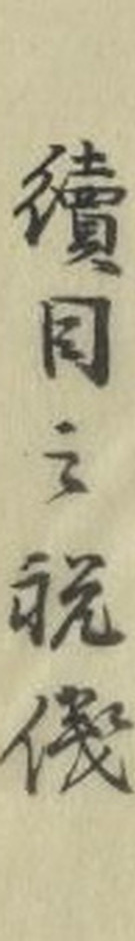續目之祝儀
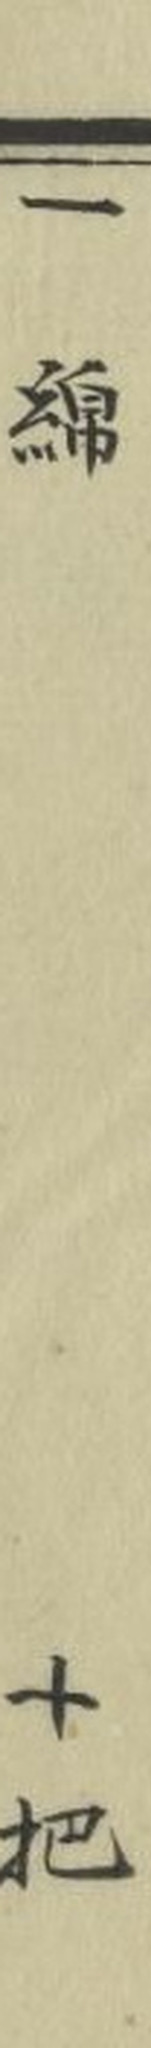一綿十把
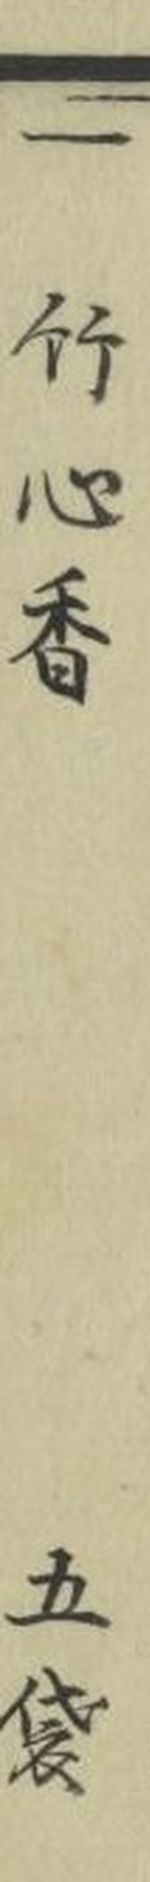一竹心香五袋

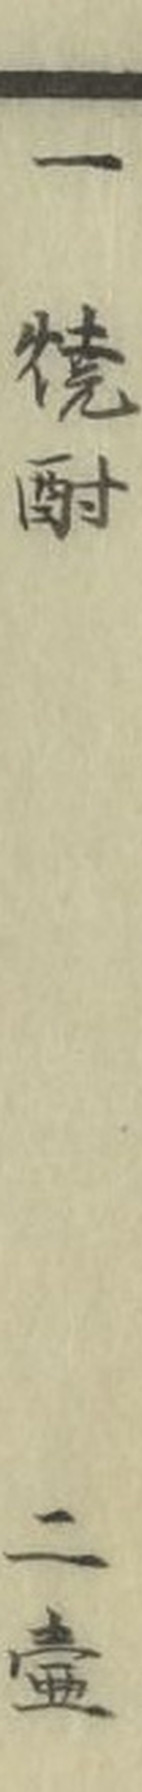一焼酎二壺
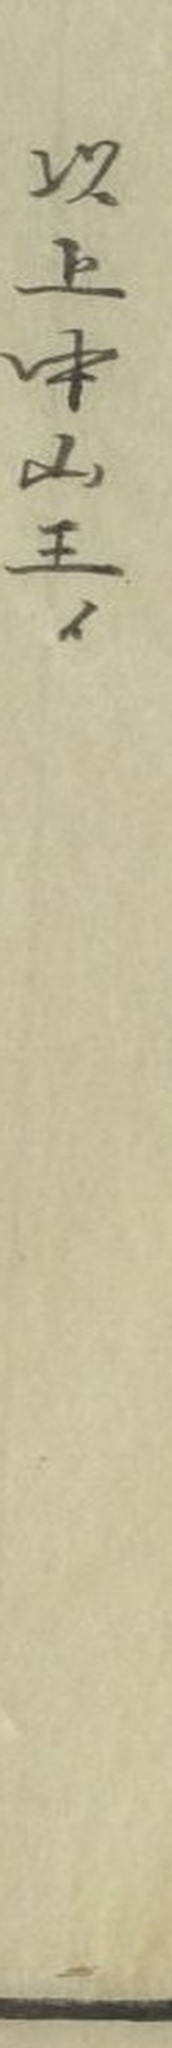以上中山王ゟ
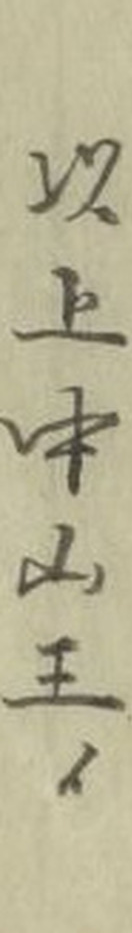以上中山王ゟ
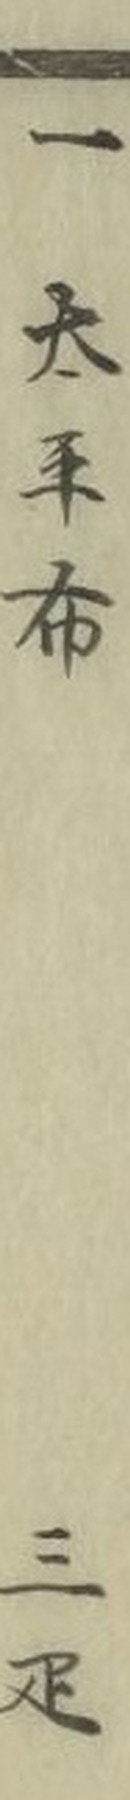一太平布三疋
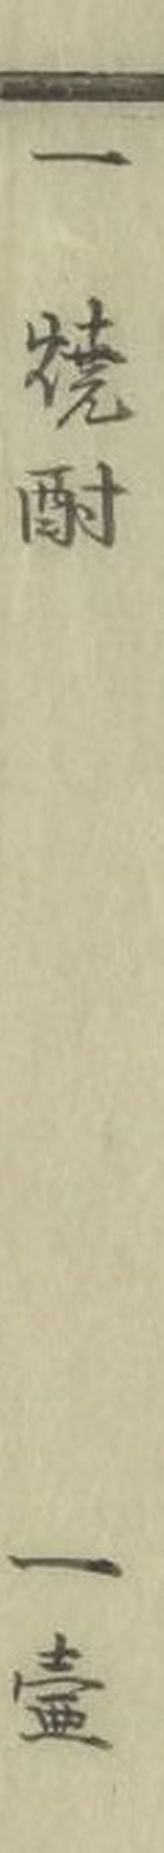一焼酎一壺
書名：琉球往来（上）
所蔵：University of the Ryukyus Library
